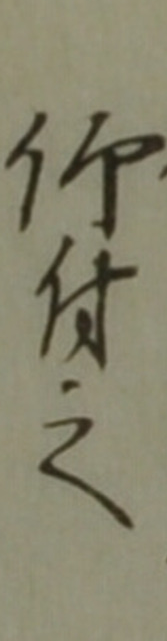仰付之
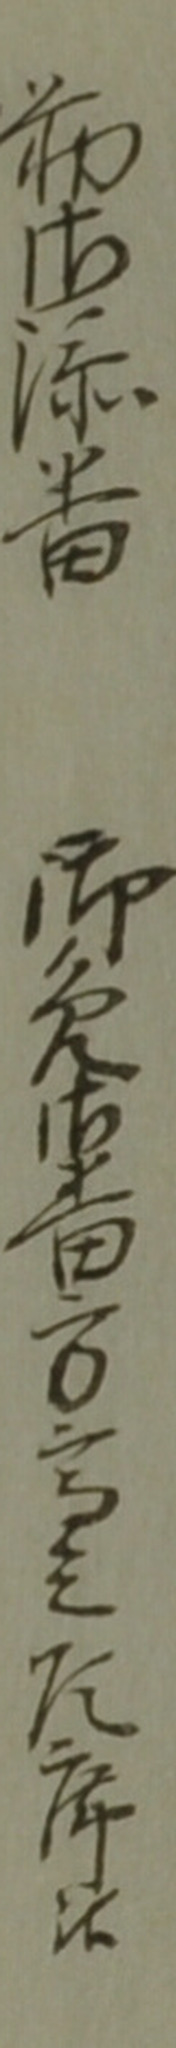勤御添番御免御番方高之頭席被
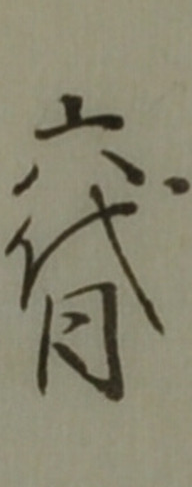六代目
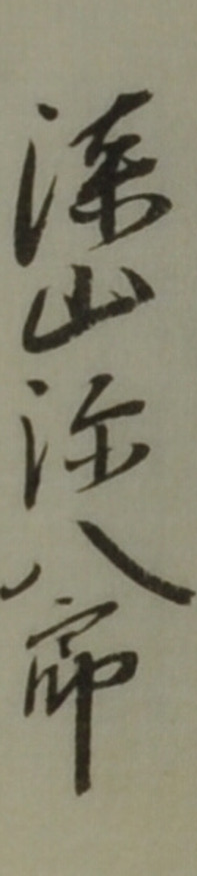漆山弥八郎
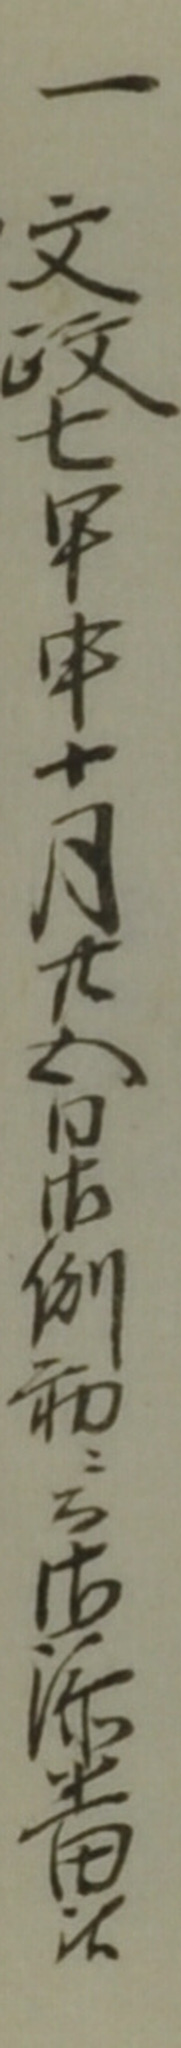一文政七甲申十月廿五日御側勤ニ而御添番被
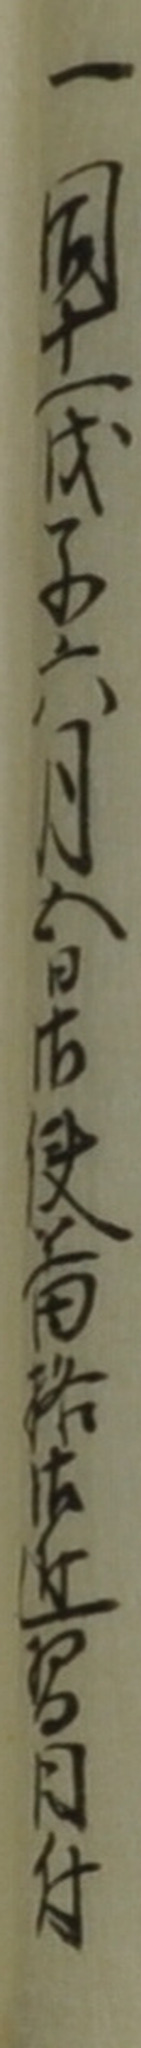一同十一戌子六月五日御使番格御近習目付
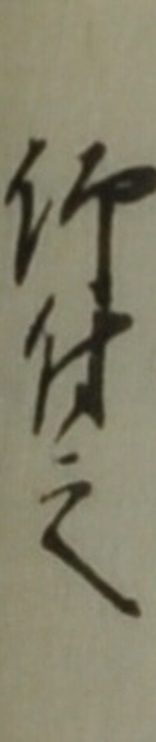仰付之
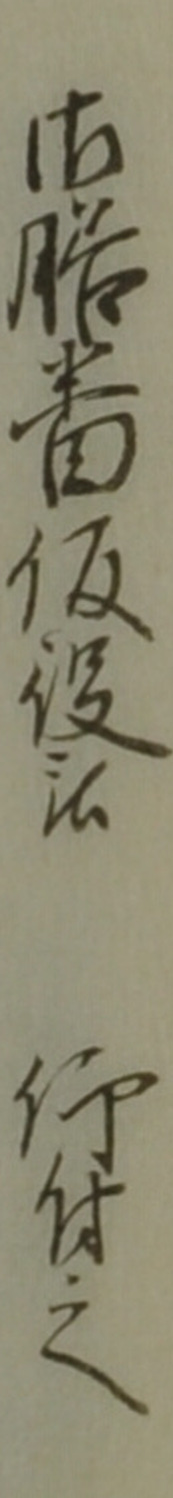御膳番仮役被仰付之
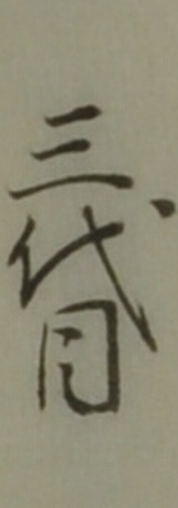三代目
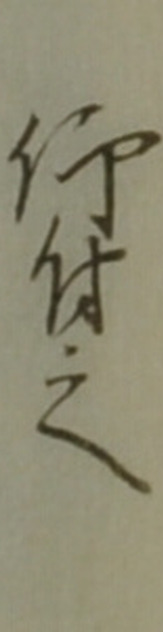仰付之
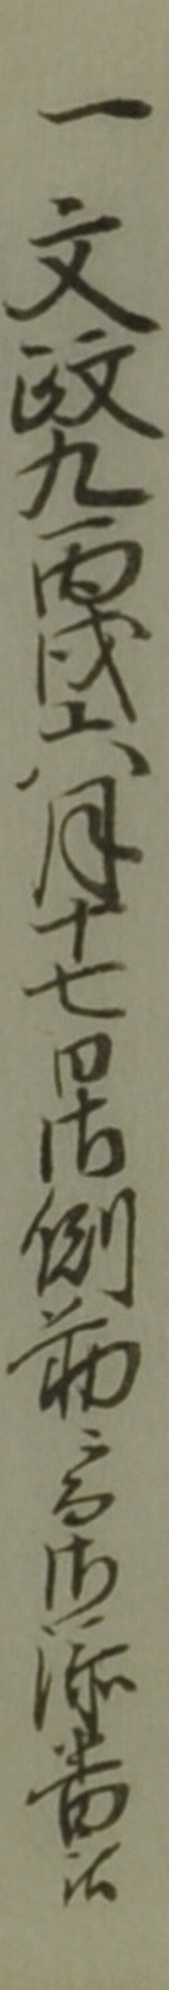一文政九丙戌六月十七日御側勤ニ而御添番被
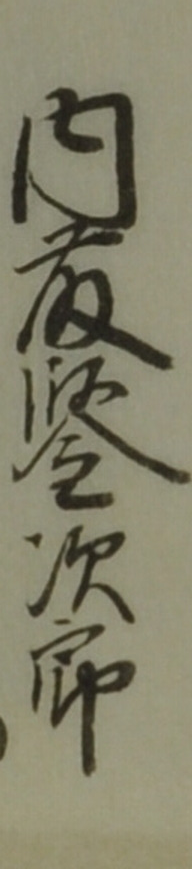内藤鏨次郎
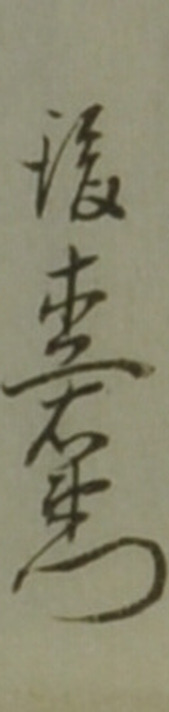後杢右衛門
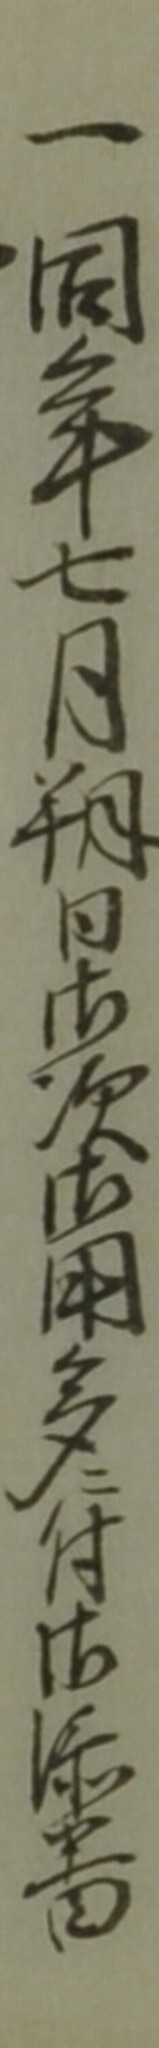一同年七月朔日御次御用多ニ付御添番
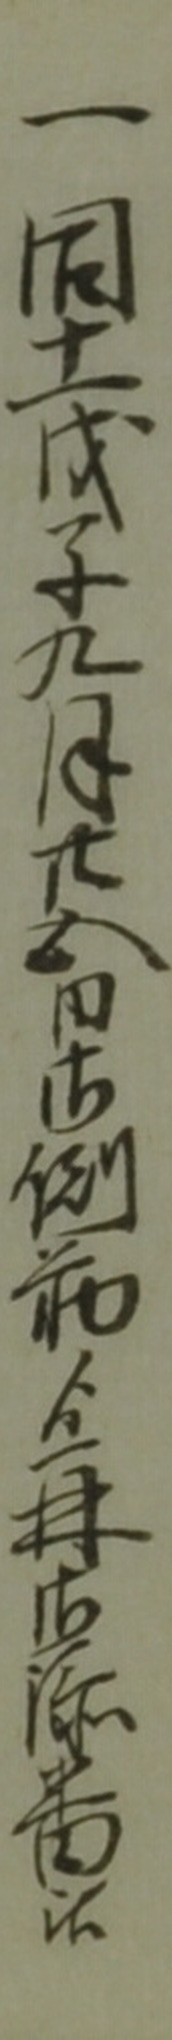一同十一戌子九月廿五日御側勤より再御添番被
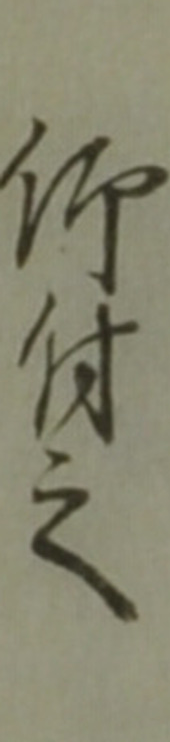仰付之
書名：諸御役代々録（八）
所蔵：伊那市立高遠町図書館・合同会社AMANE
